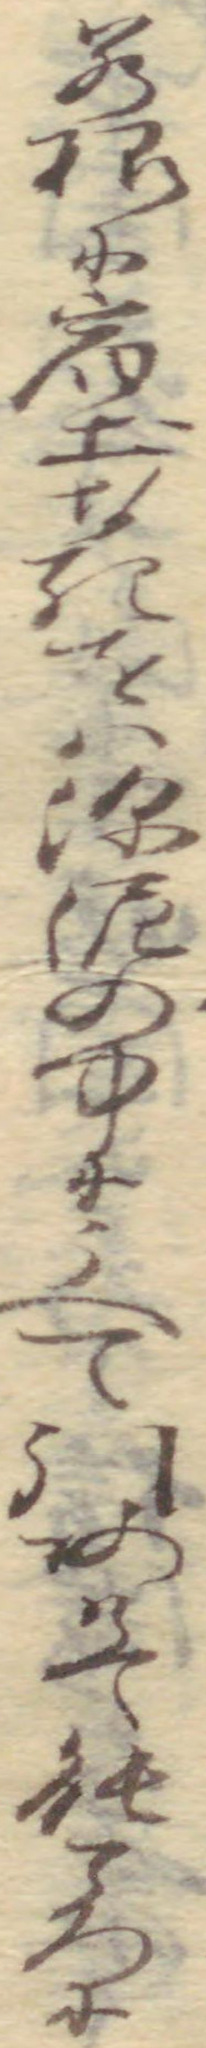若根に宿土なきをハ深泥の中にうへて引あけて能ころに
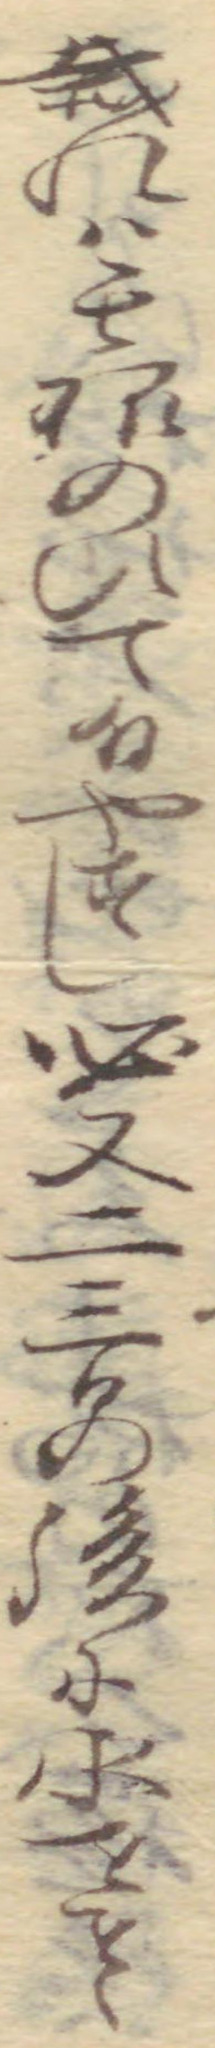栽れハ其根のひて付やすし必又ニ三日の後に水をそゝ
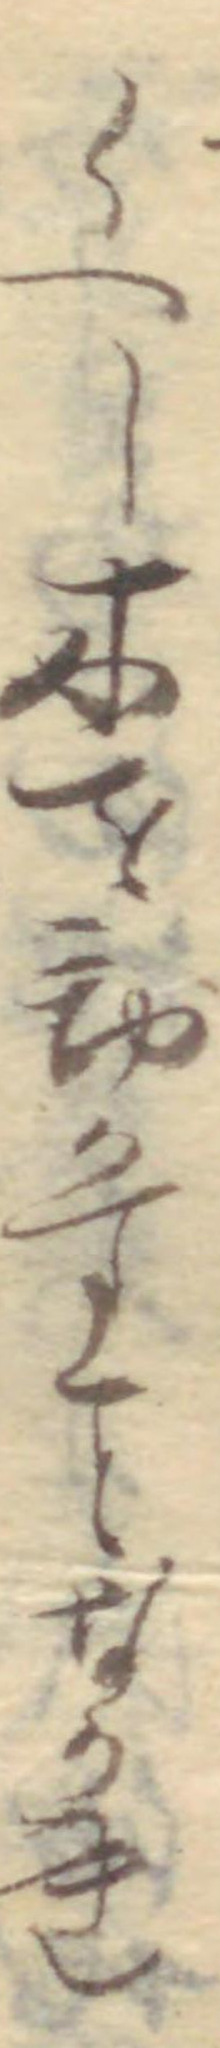くへし木を動かすことなかれ
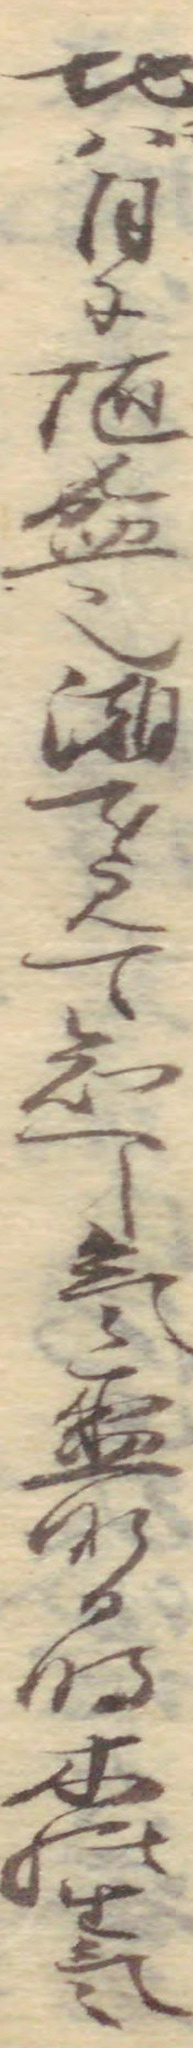地気ハ月に隨盛也潮を見て知へし気盛なる時木の生気
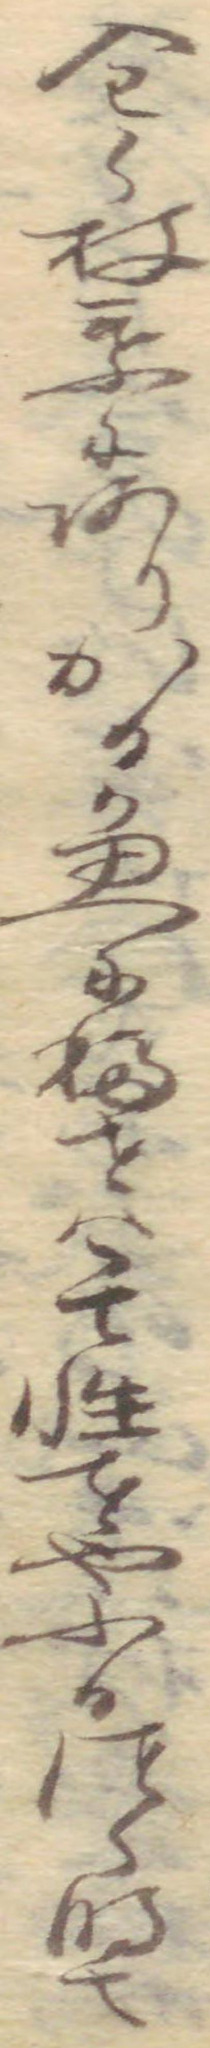全く枝葉にありかるかゆへに移せハ其性をやふるつく時は
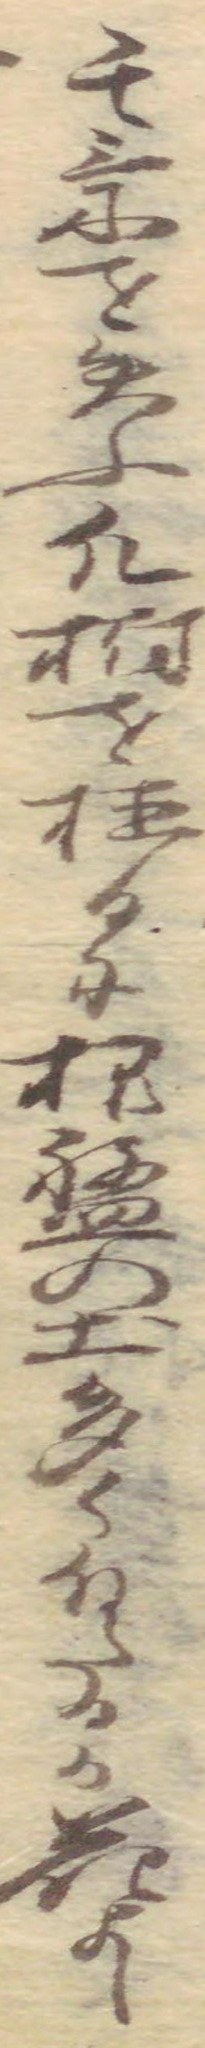其気を失ふ凡そ樹を植るに根盤の土多く付たるか花よし
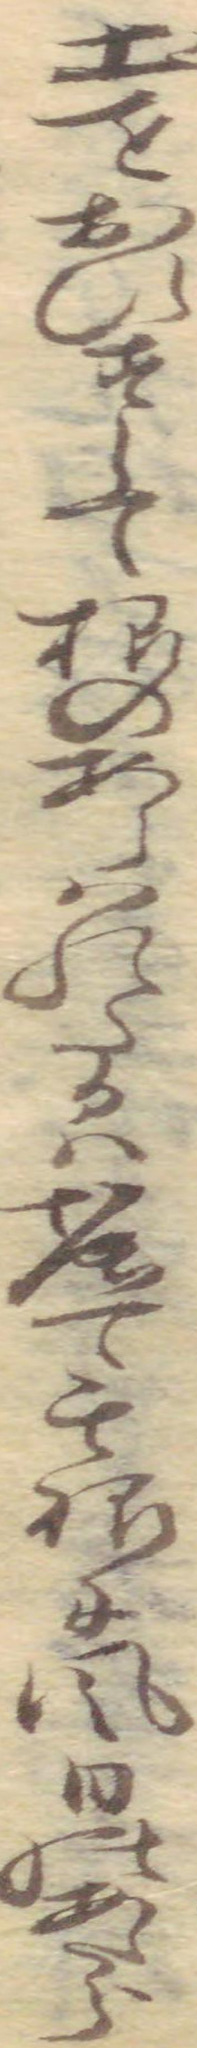土をおひすして根のあらハれたるハ堀て其根に風日のあたら
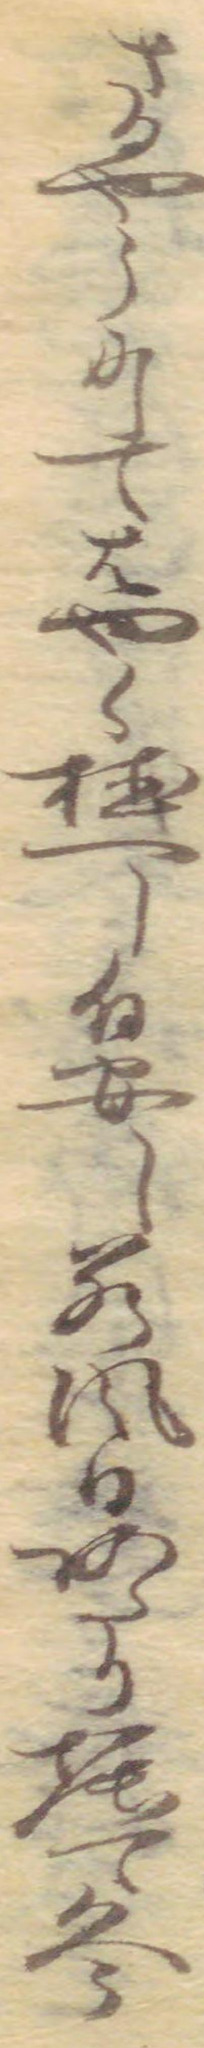さるやうにしてはやく植へし付安し若風日あたり堀て久く

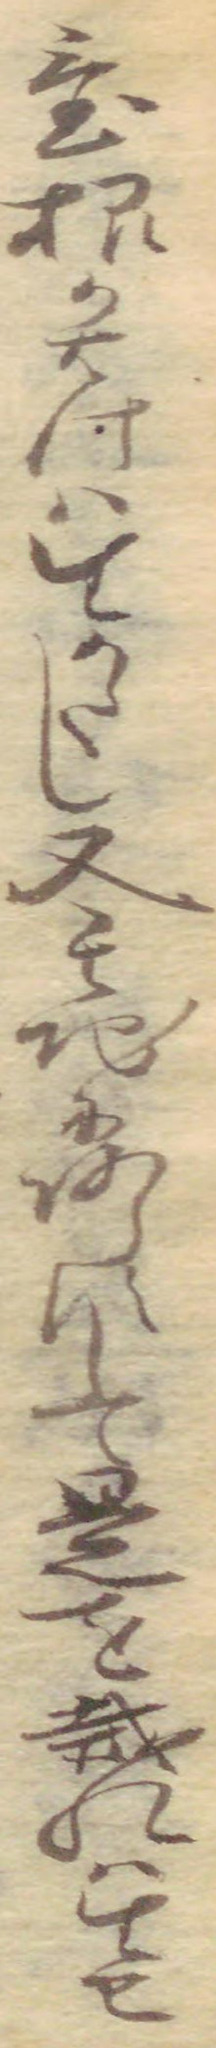置根かは付はハ生かたし又其地にあらすして是を栽れハ生せ
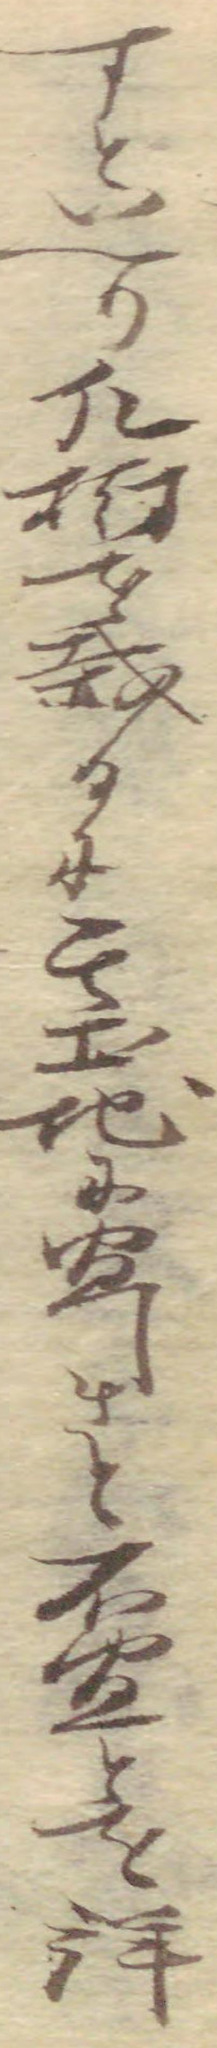すといへり凡樹を栽るに其土地に宜しきと不宣とを詳
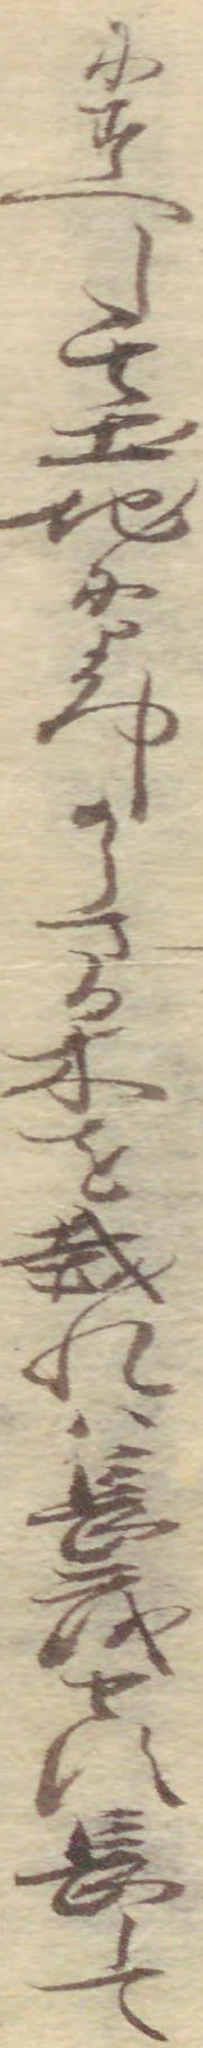にすへし此土地によろしからさる木を栽れハ長茂せす長して
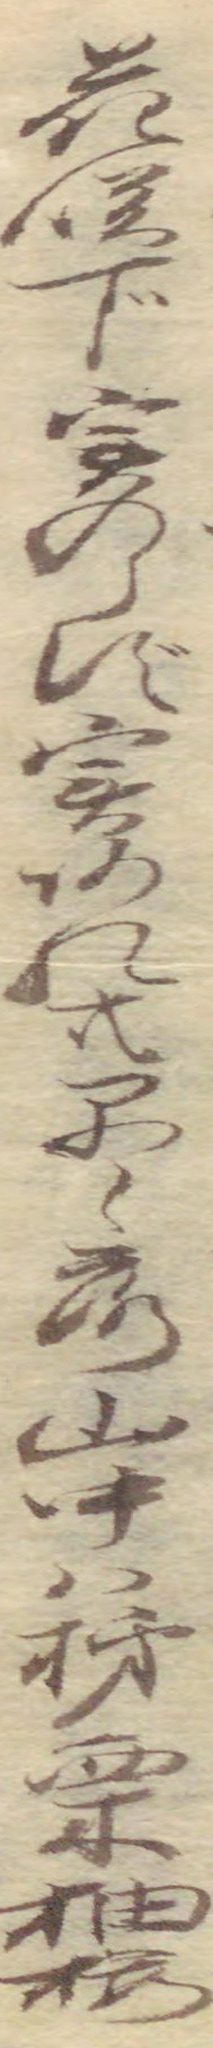花咲ず実のらず実あれ共早く落山中ハ柿栗柚梅
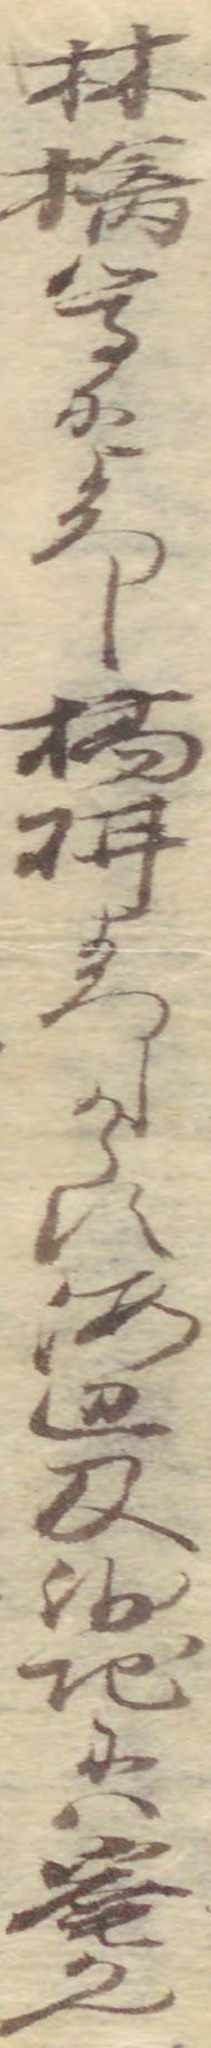林檎等によろし橘柑よろしからす海辺及砂地にハ蜜かん
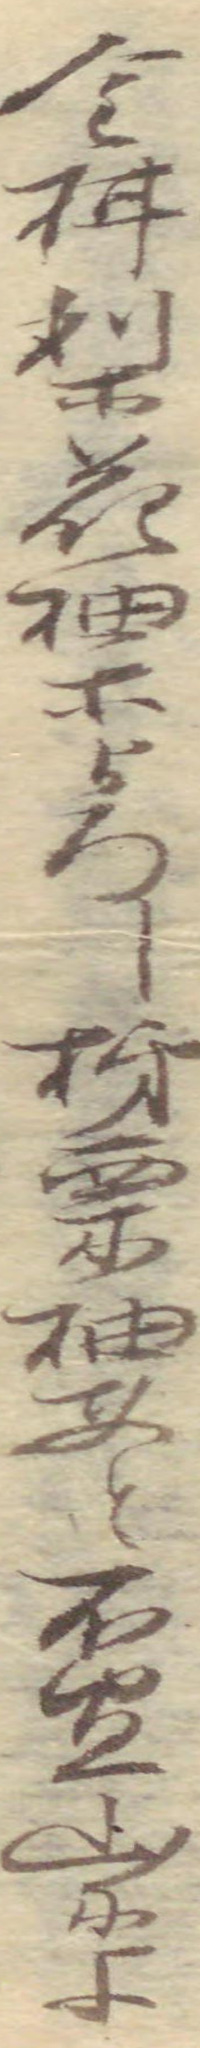金柑梨花柚等よろし柿栗柚なと不宜山によ
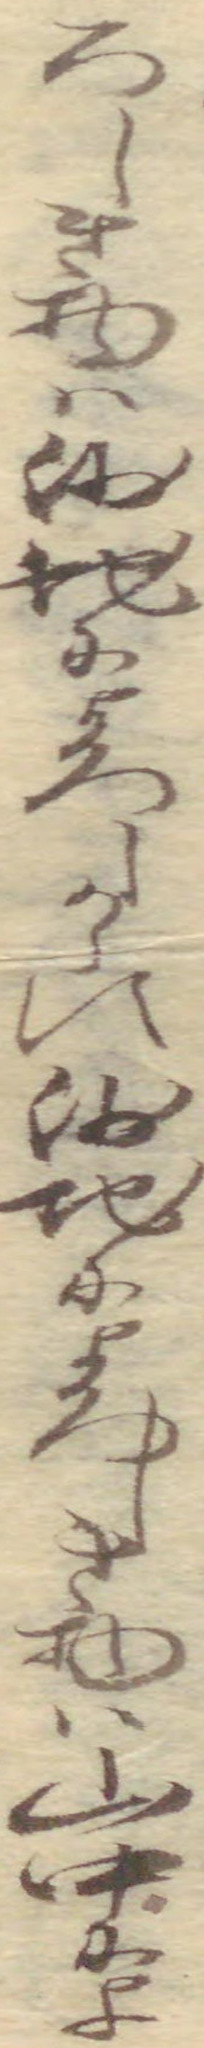ろしき物ハ砂地によろしからす砂地によろしき物は山中によ
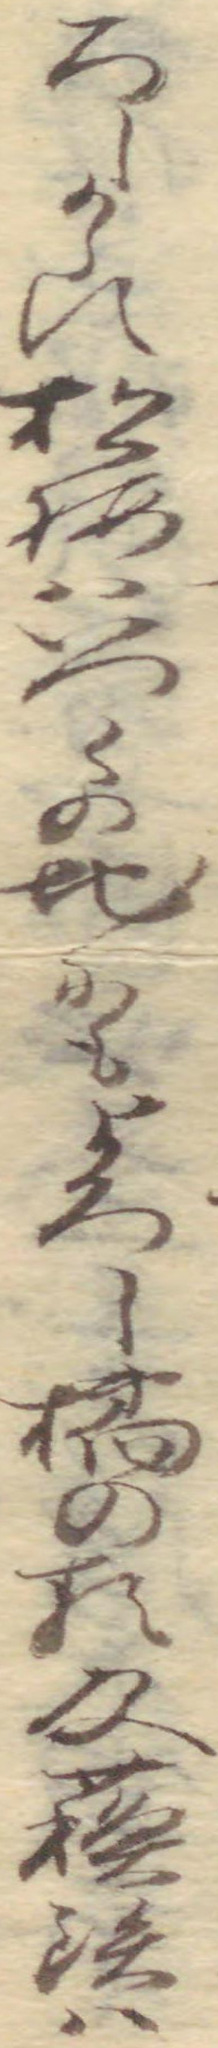ろしからす松梅ハいつくの地にもよろし橘の類及蘇鉄ハ
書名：鶯宿雑記. 巻199-200
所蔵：国立国会図書館 National Diet Library, JAPAN
